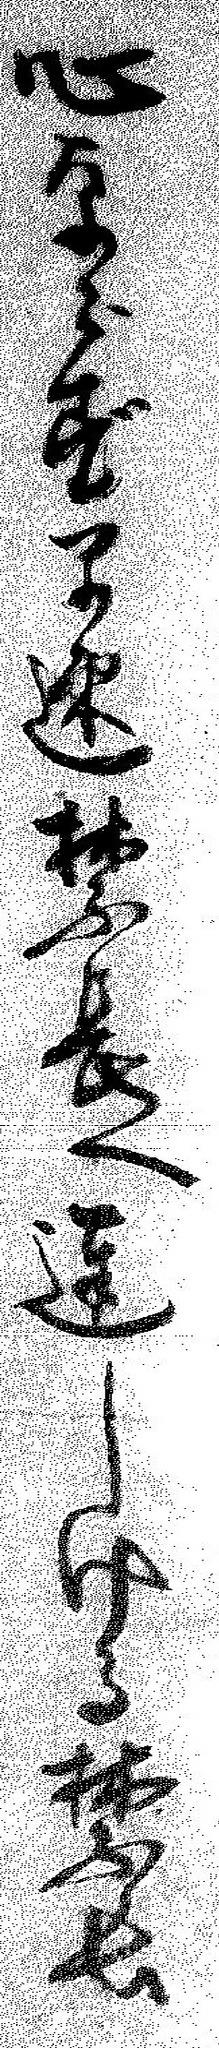心ならず早速禁長へ達しける禁長

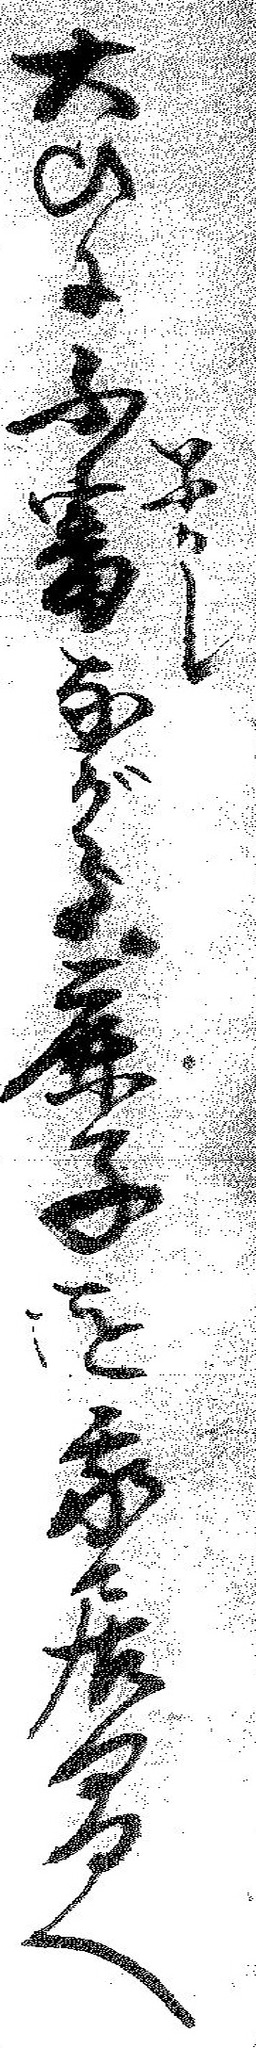大ひに不審ながら鹿子を我居間へ
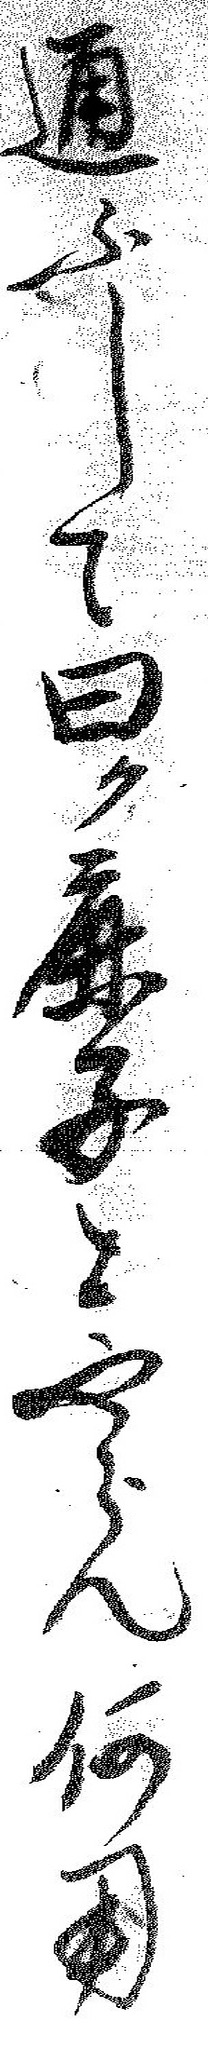通ふして曰く鹿子とやらん何用
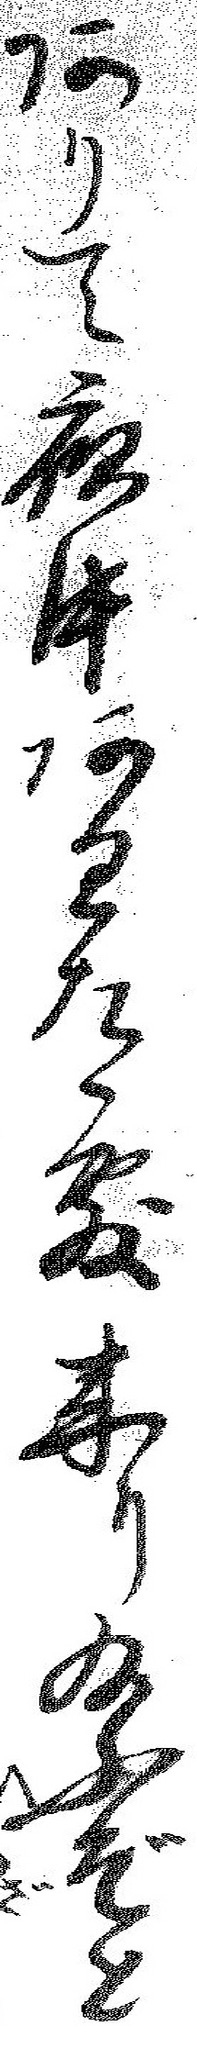ありて夜中あわたゝ敷来り給ふぞと
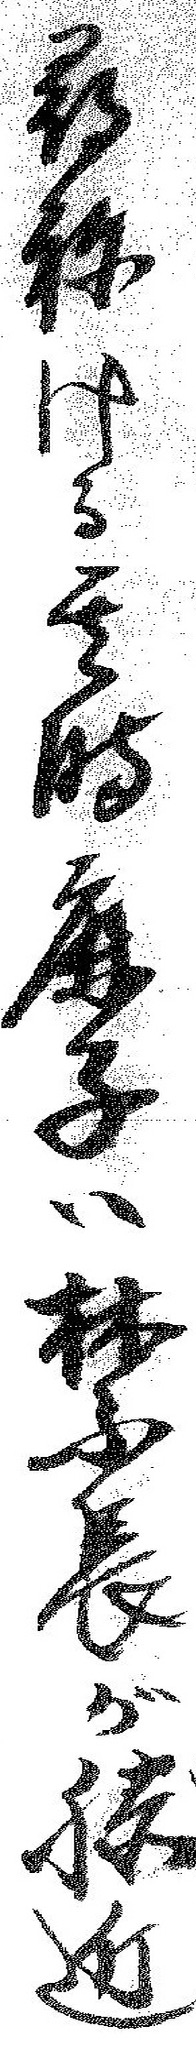尋ねける其時鹿子は禁長が膝近
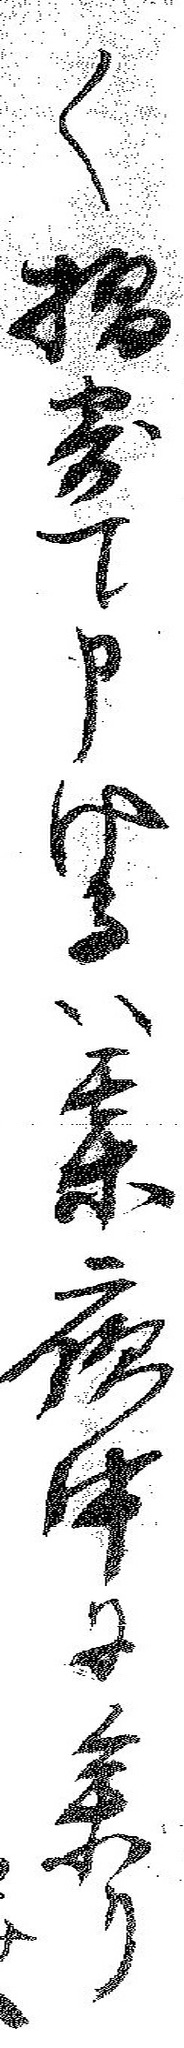く摺寄て申けるは某夜中に参り
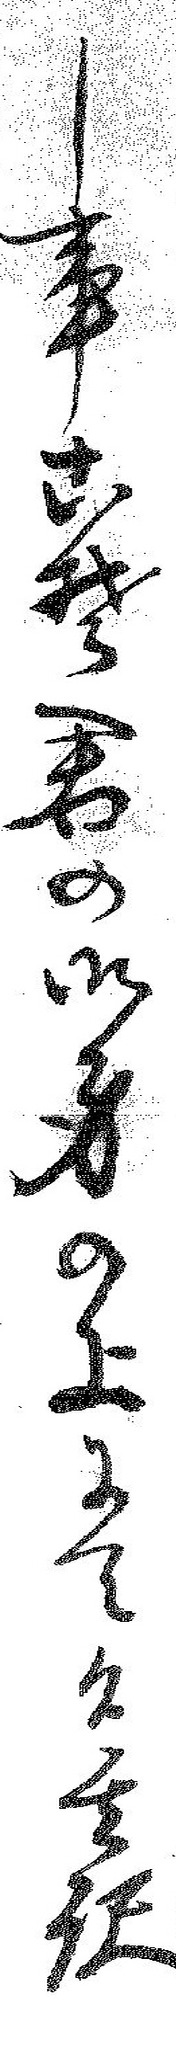し事こそ君の御身の上にて候其訳
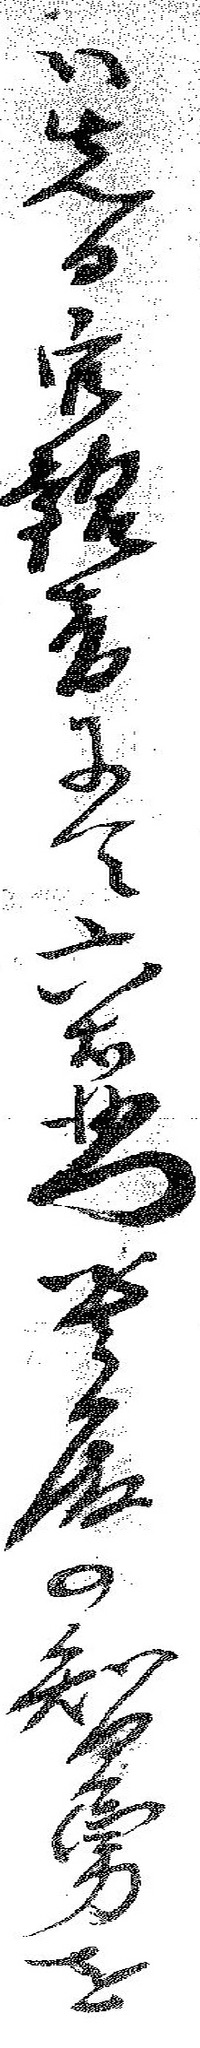は先日穴観音にて六右衛門貴殿の知勇を
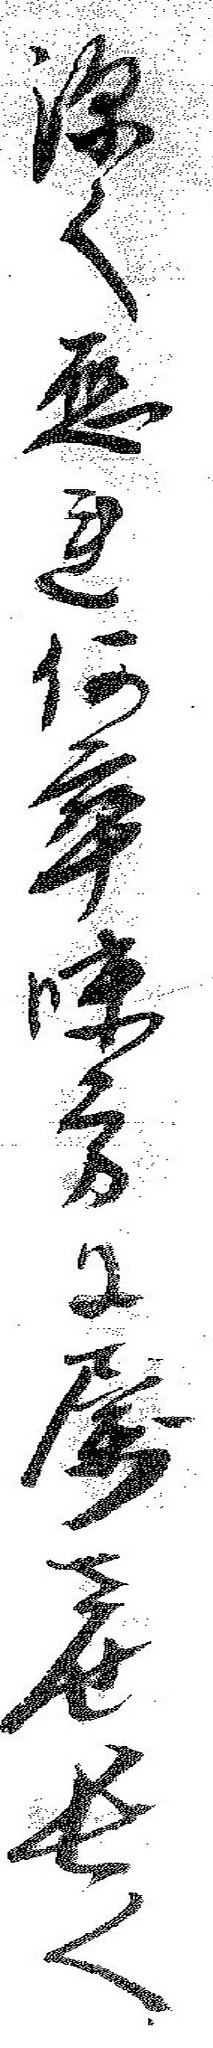深く恐れ何卒味方に属させ長く
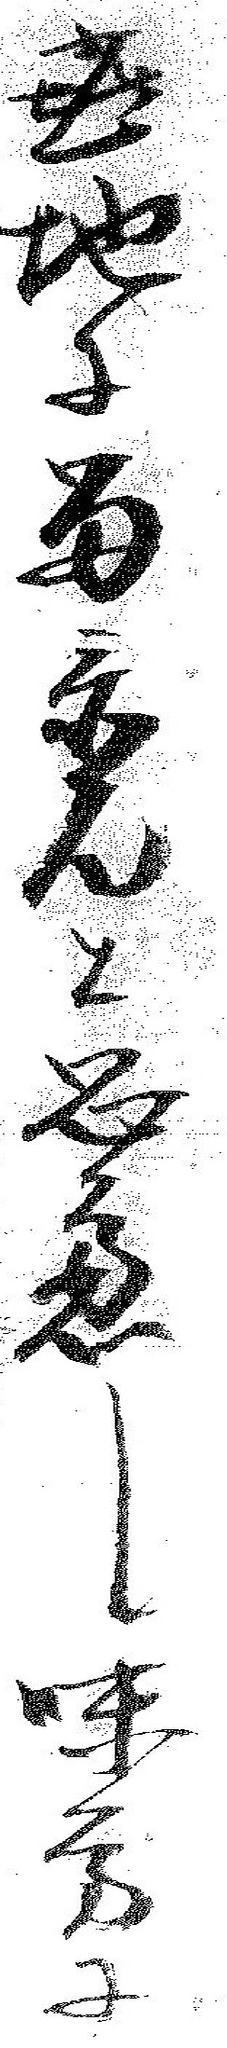当地に留置んと思慮し味方に
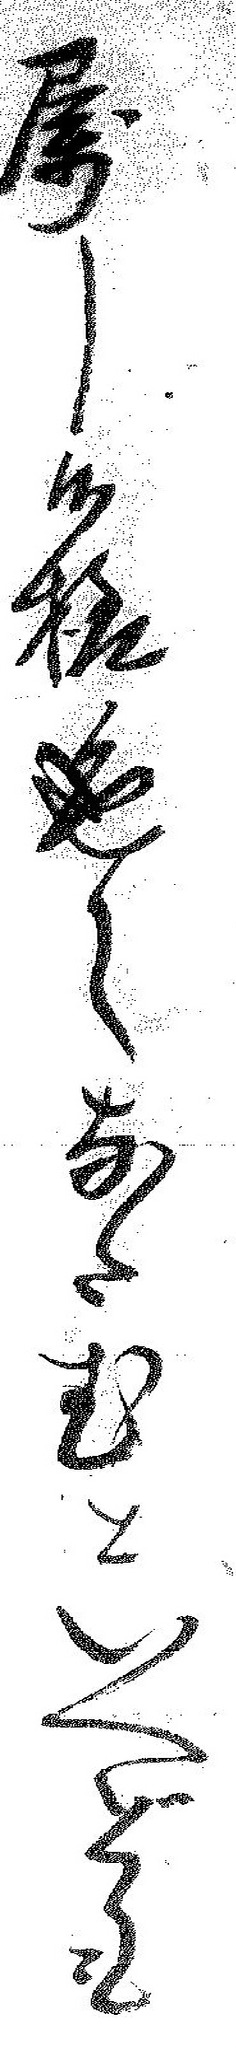属し候様色々なたむといへども
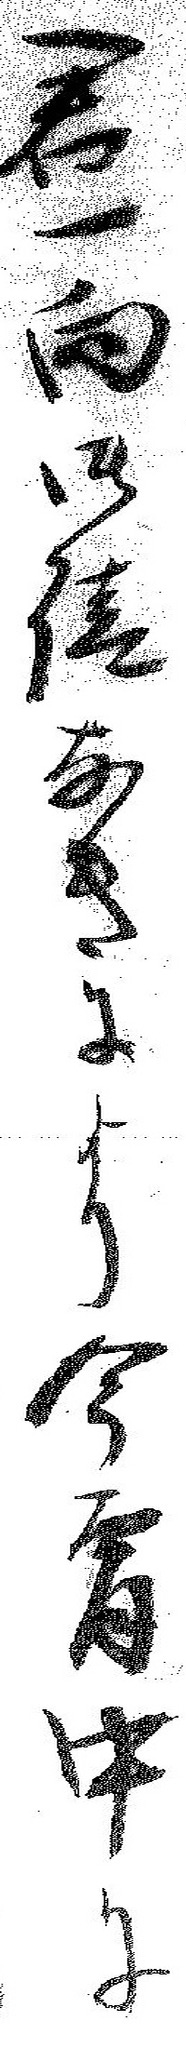君一向御請なきにより今宵中に
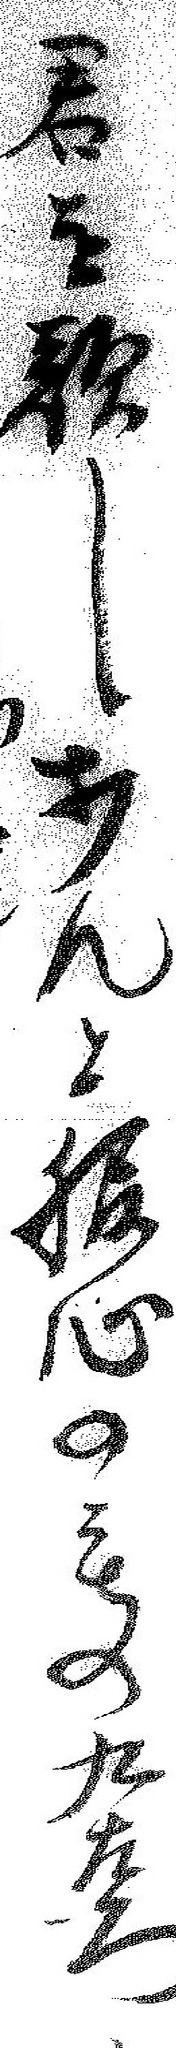君を殺し打んと腹心のもの九左衛門
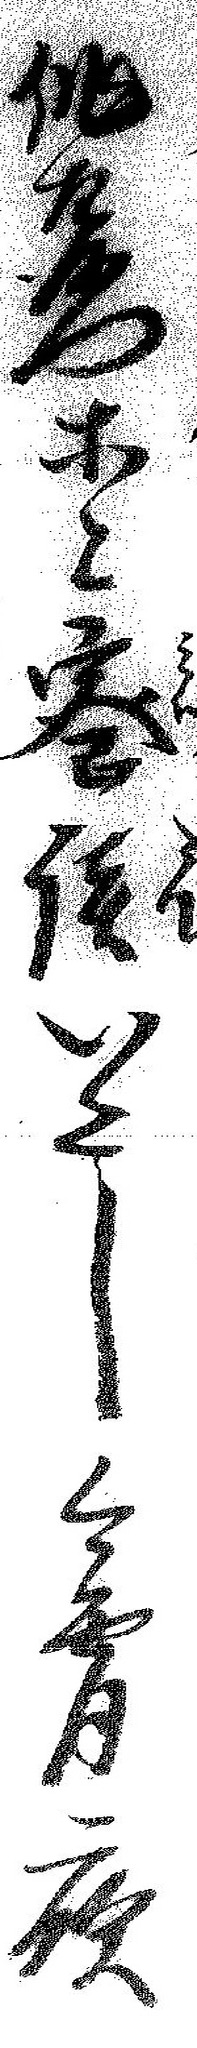作左衛門等と密談いたし今宵夜
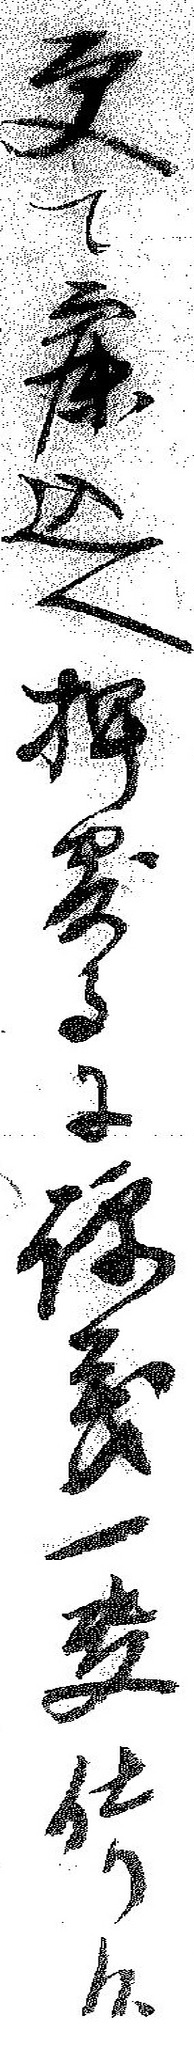更て寝込へ押寄るに評義一決仕り候
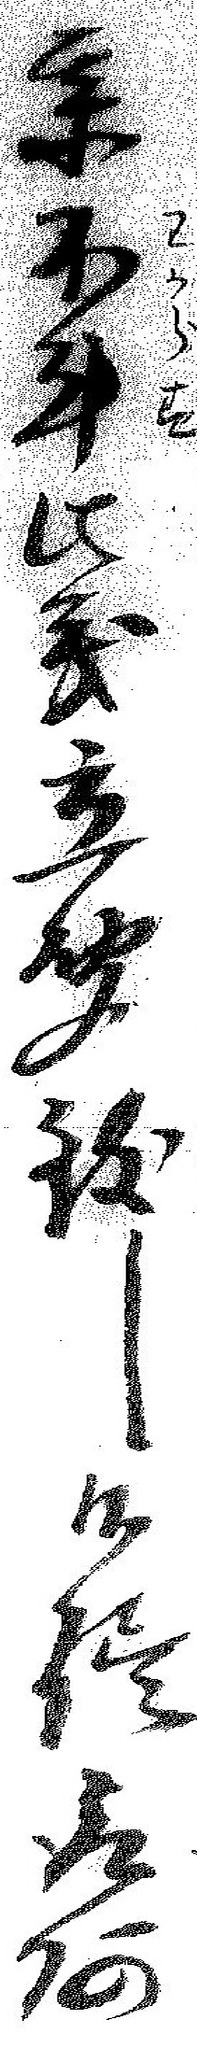某不斗此義立聞致し候侭取あ
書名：近頃古狸珍説　礼義智信
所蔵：徳島県立図書館
